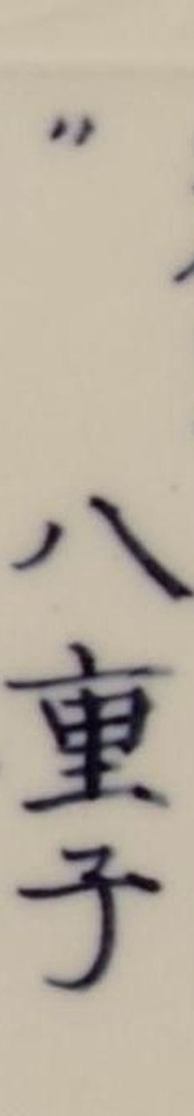八重子
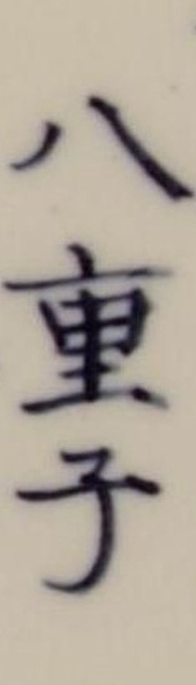八重子
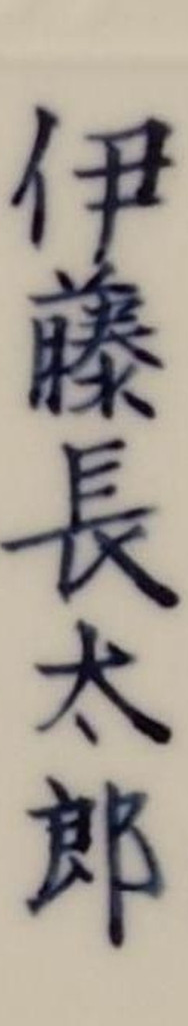伊藤長太郎
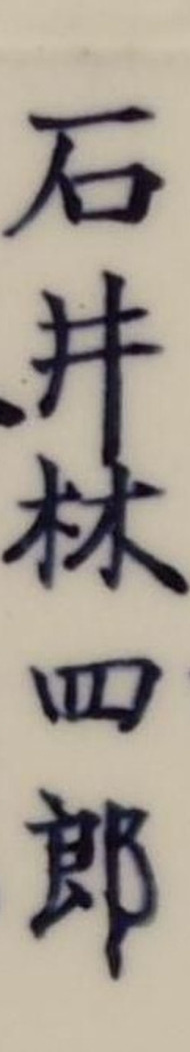石井林四郎
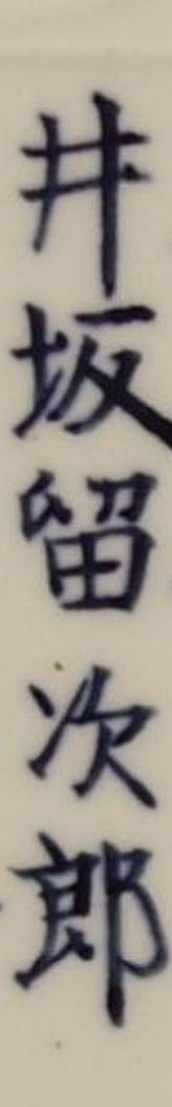井坂留次郎
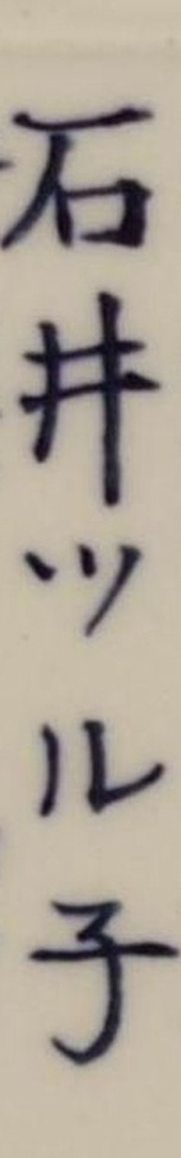石井ツル子
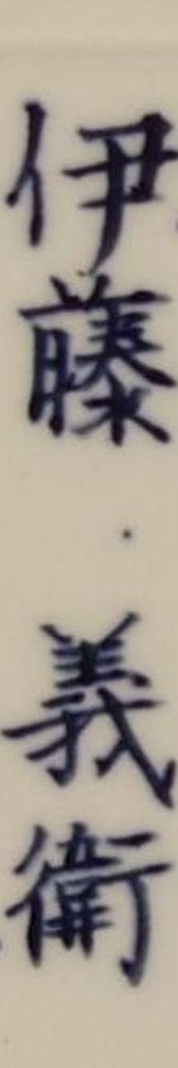伊藤義衛
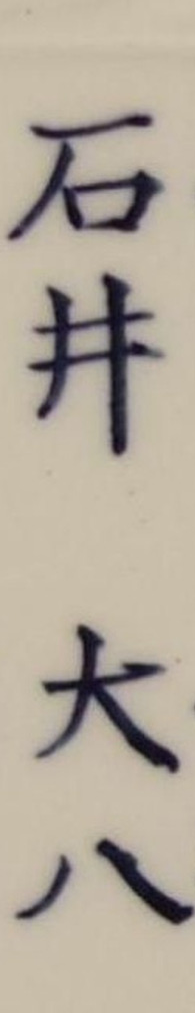石井大八
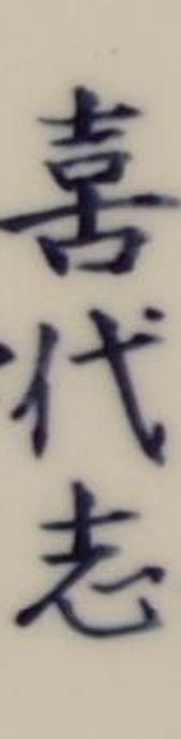喜代志
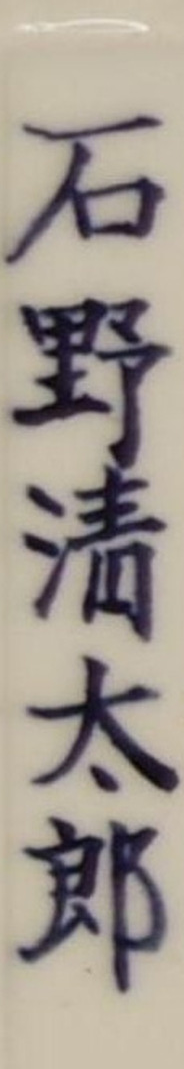石野清太郎

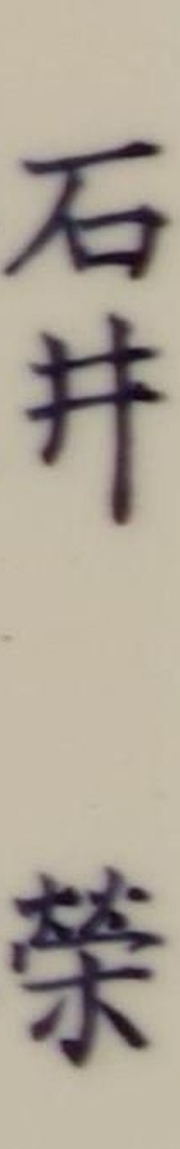石井榮
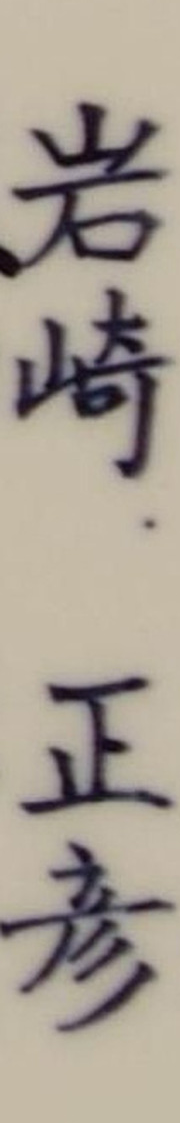岩崎正彦
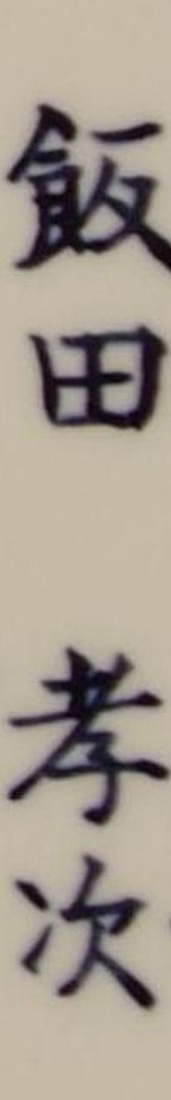飯田孝次
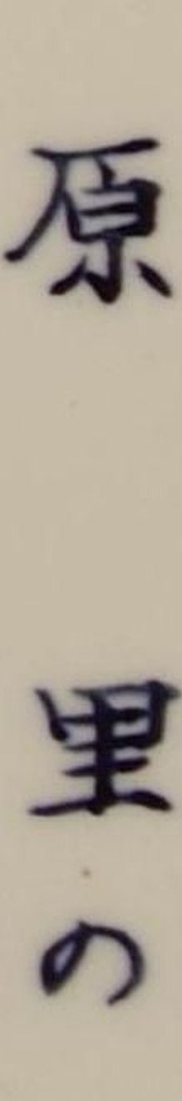原里の
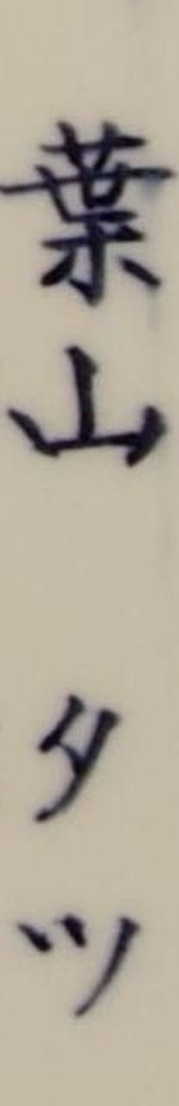葉山タツ
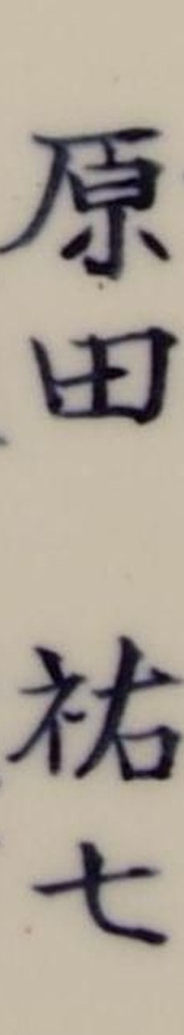原田祐七
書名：E~L
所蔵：高野山金剛峯寺
